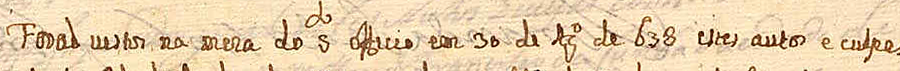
Foraõ uistos na meza do Sto officio em 30 de Ago de 638 estes autos e culpas
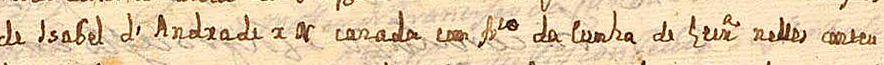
de Isabel d' Andrade x N cazada com frco da Cunha de Leira nelles conteu
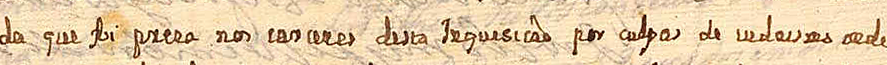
da que foi preza nos carceres desta Inquisicão por culpas de iudaismo onde
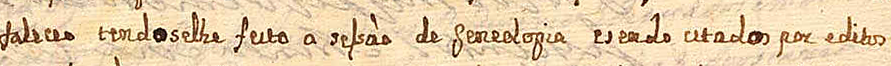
faleceo tendoselhe feito a sessão de Geneologia e sendo citados por editos
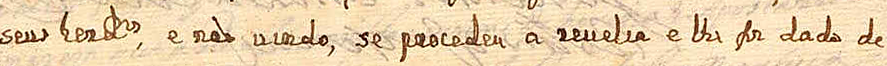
seus herdros, e não uindo, se procedeu a reuelia e lhe foi dado de
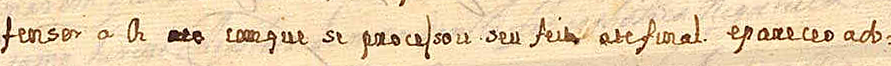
fensor a R __ com que se processou seu feito ate final. e pareceo a to
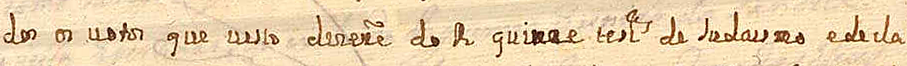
dos os uotos que uisto dizerē do R quinze testas de Iudaismo e decla
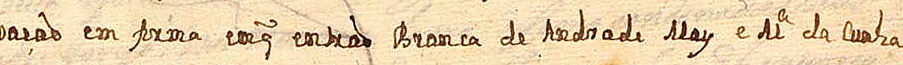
ração em forma em q̄ entrão Branca de Andrade May e Ma da Cunha
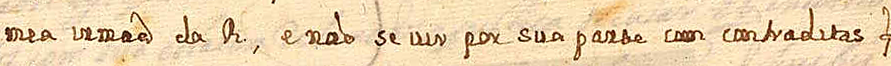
mea irmaā da R, e não se uir por sua parte com contraditas q̄
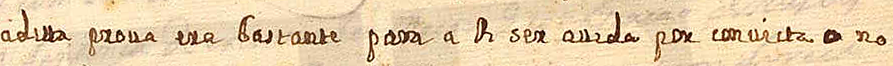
a ditta proua era bastante para a R ser auida por conuicta o no
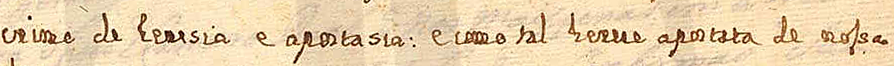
crime de heresia e apostasia: e como tal hereie apostata de nossa
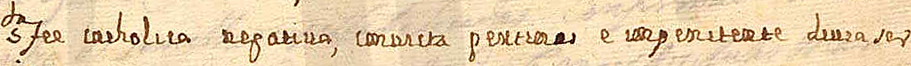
sta fee catholica negatiua, conuicta pertinas e impenitente diuia ser
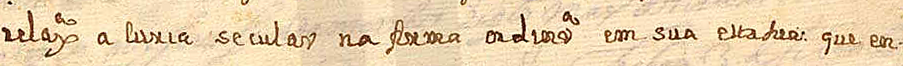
relaxa a Curia secular na forma ordinra em sua estatua: que en
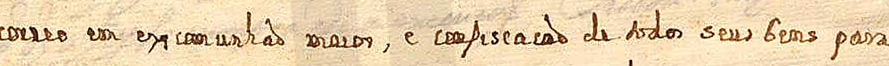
correo em excomunhão maior, e confiscacão de todos seus bens para
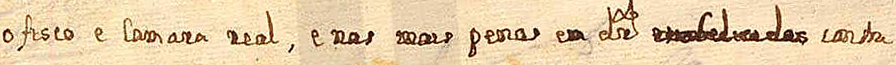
o fisco e Camara real, e nas mais penas em drto estabelicidas contra
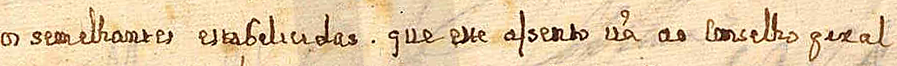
os semelhantes estabelicidas . que este assento uā ao Conselho geral
